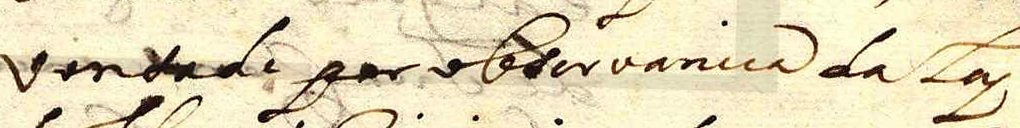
verdade por observancia da Ley,
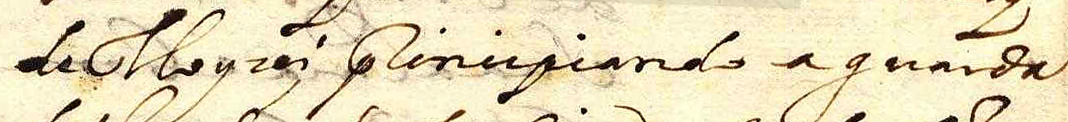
de Moyzes, pRincipiando a guarda
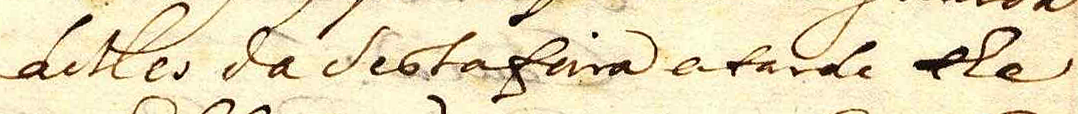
delles da sesta feira a tarde the
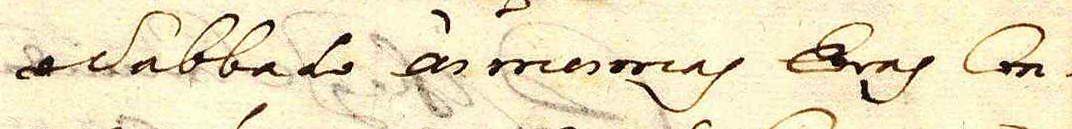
o Sabbado às mesmas horas Con
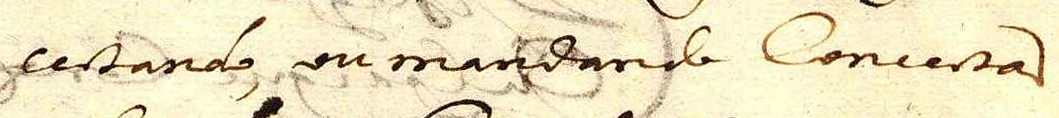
certando ou mandando Concertar
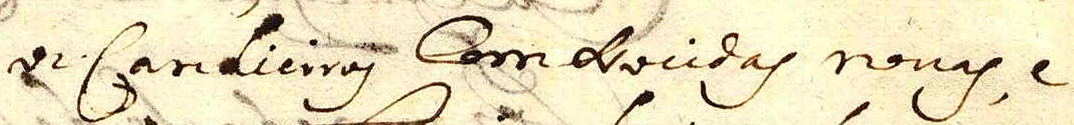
os Candieiros Com trocidas nouas, e
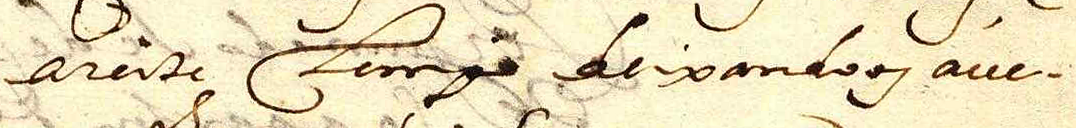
azeite Limpo, deixandoos acce
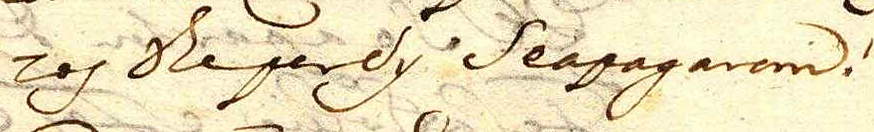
zos the per Sy se apagarem?
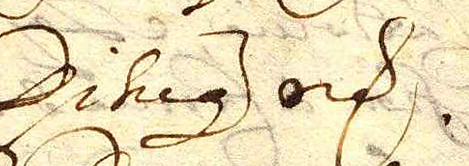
Disse q̄ naõ.
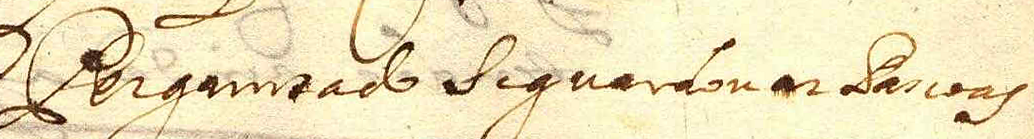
Perguntado se guardou as Pascoas
